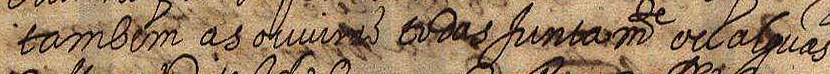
tambem as ouuiraõ todas Juntamte ou alguās
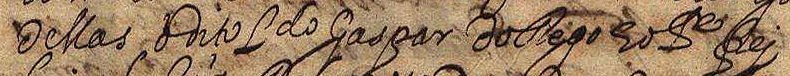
dellas o dito Ldo Gaspar do Rego E o Pe frej
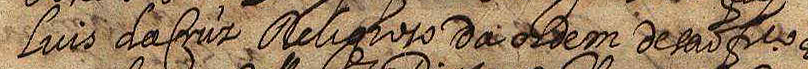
Luis da Cruz Religioso da ordem de saõ fr.co E
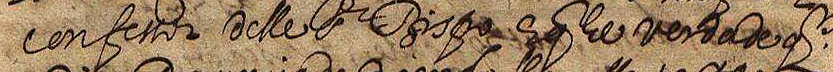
confessor delle sor Bispo E q̄ he verdade q̄.
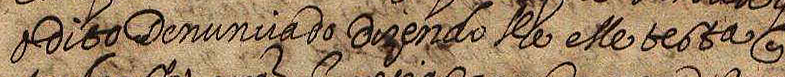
o dito Denunciado dizendo lhe elle testa q̄
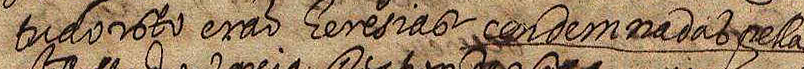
tudo isto eraõ heresias condemnadas pella
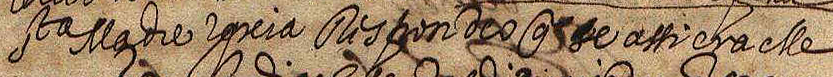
sta Madre Igreia Respondeo q̄ se assi era elle
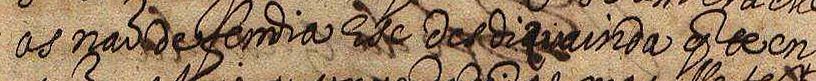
as naõ defendia E se desdizia ainda q̄ te en
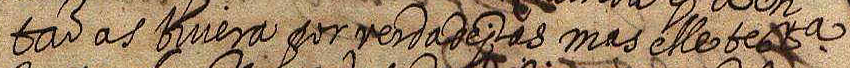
taõ as tiuera por verdadeiras mas elle testa
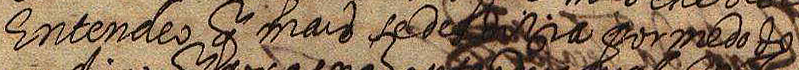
Entendeo q̄ mais se desdizia por medo do
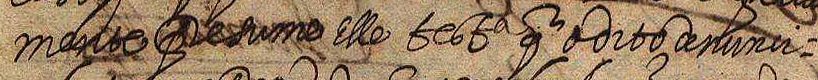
mente presume Elle testa q̄ o dito denunci
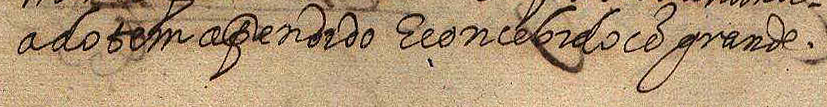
ado tem aprendido E concebido cō grande
